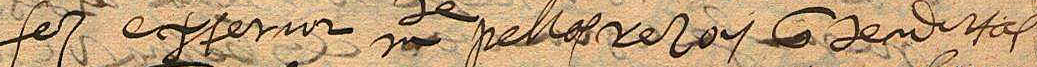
fez exteriormte pellas rezois q̄ ten dittas
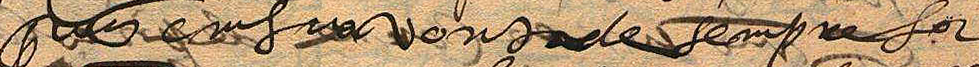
p̄oq̄ em sua vontade sempre foj
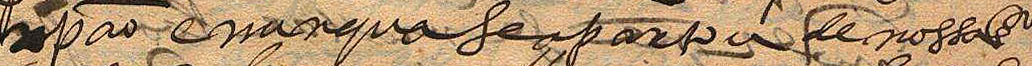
xpão e nunqua se apartou de nossa sta
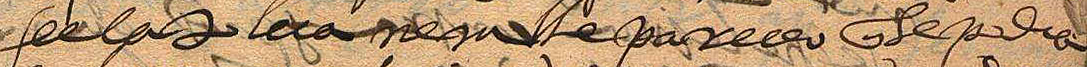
fee Catolica nem lhe pareceo q̄ se podia
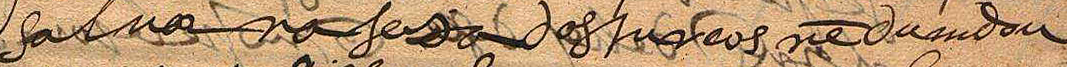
saluar na seita dos turcos nē duuidou
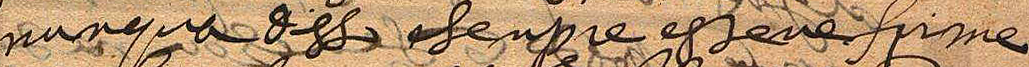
nunqua disso e senpre esteue fjrme
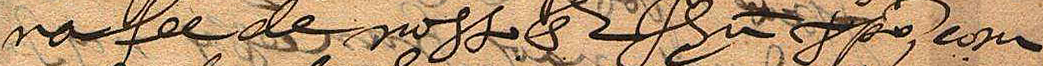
na fee de nosso sor Jhū xpō, com
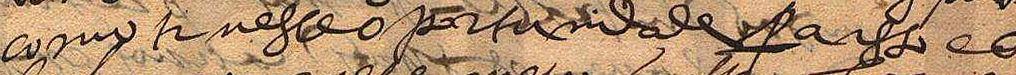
como tiuesse oportunidade ꝑa isso e q̄
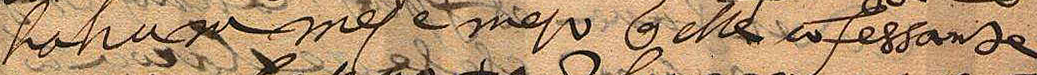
ha hum mes e mejo q̄ elle cōfessante
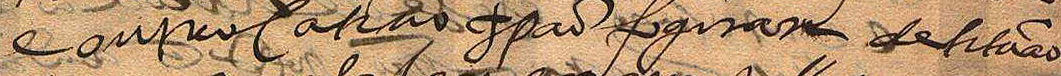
e outro Catiuo xpaõ fogiram de tituão
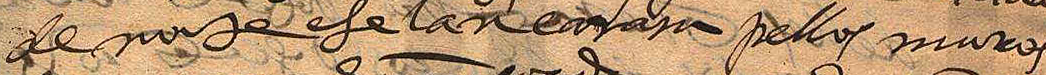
de noite e se lançaram pellos muros
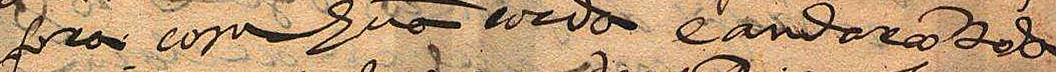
fora com hūa corda e andaraõ toda
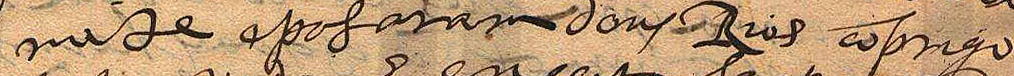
noite e pasaram dous Rios c̄o prigo
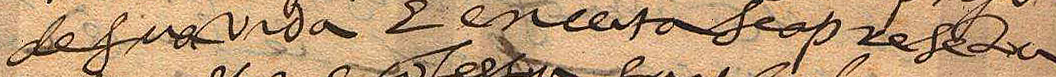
de sua vida E en ceita se apresētou
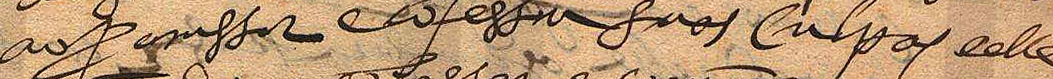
ao ꝓouissor e cōfessou suas Culpas e elle
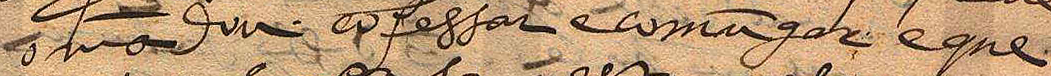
o mādou cōfessar e comūgar e que
